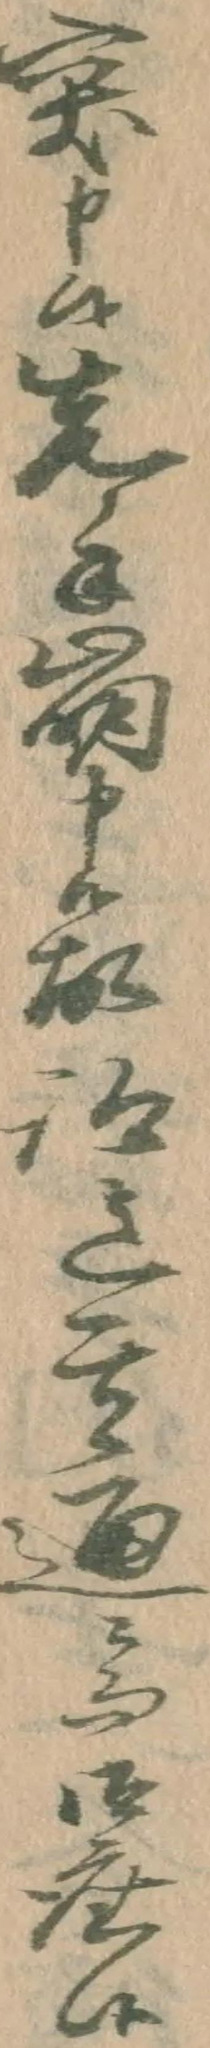突申候先手崩申候故跡迄其通に而御座候
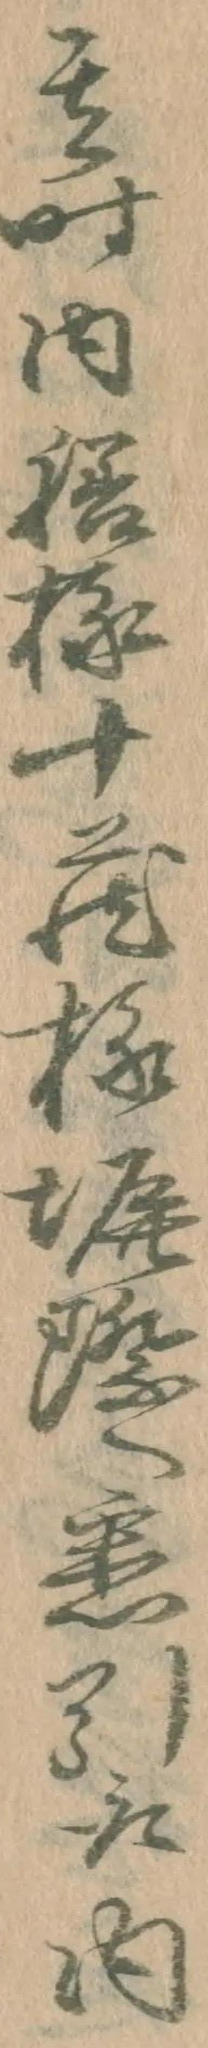其時内膳様十蔵様塀際へ悉引取内
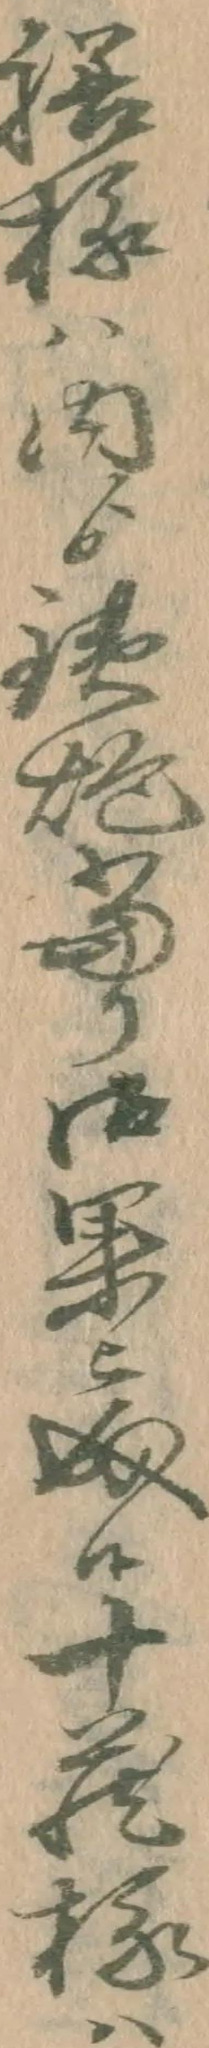膳様は内ゟ鉄砲当り御果被成候十蔵様は
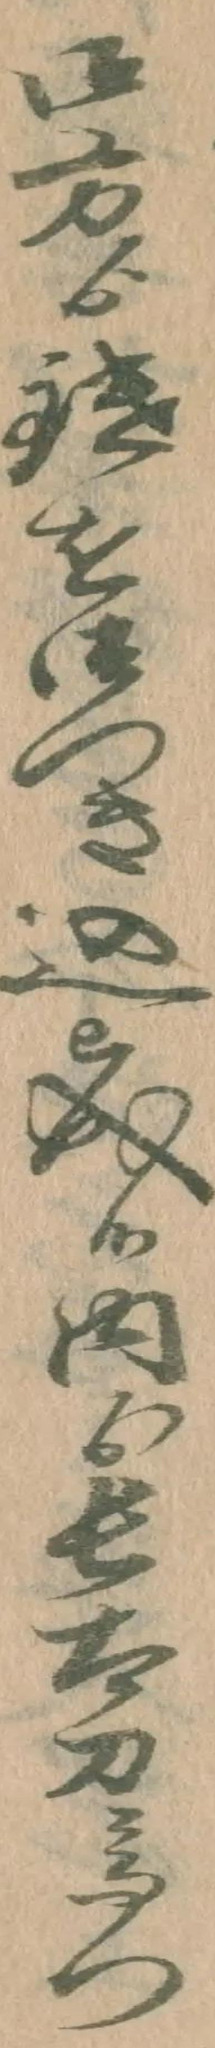御方ゟ鑓を御つき込被成候内ゟ長太刀に而つ
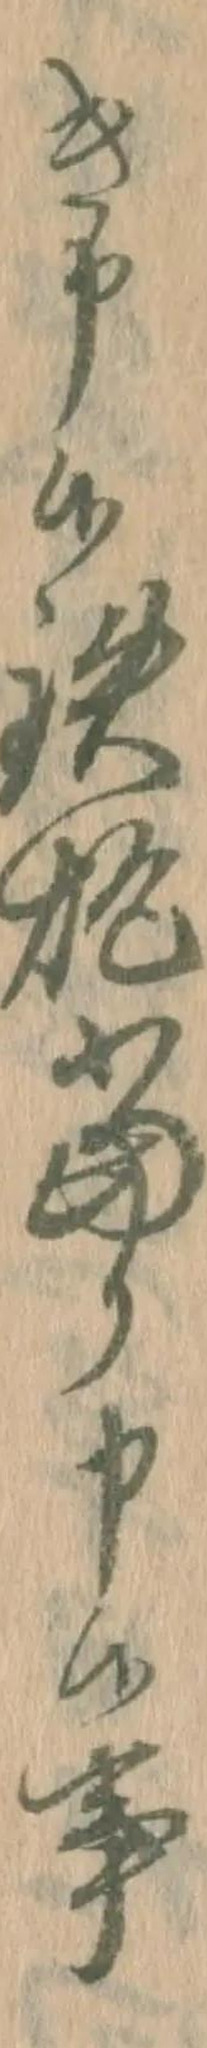き申候鉄砲当り申事
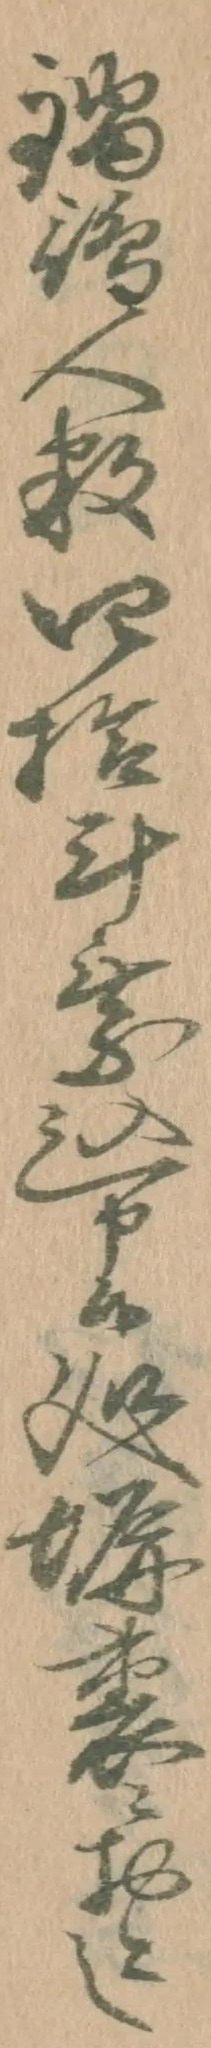一鍋島人数四拾斗乗込申候処塀裏におとし
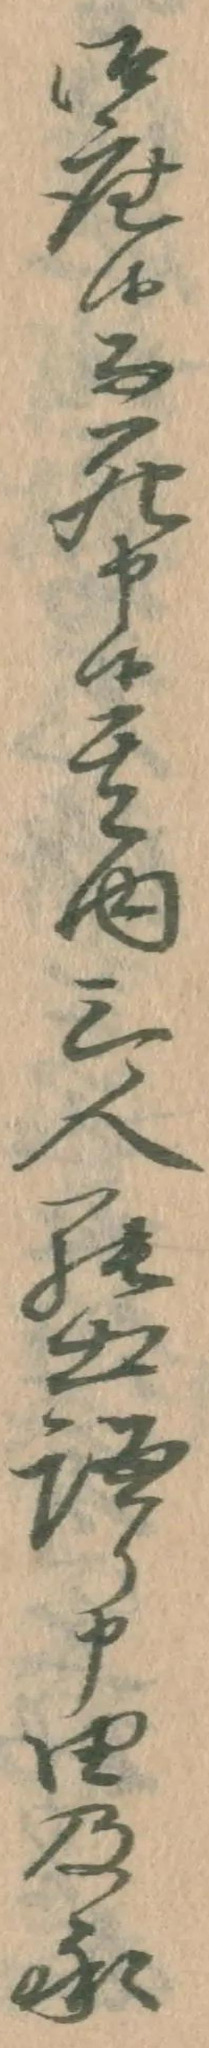御座候而死申候其内三人罷出語申由及承
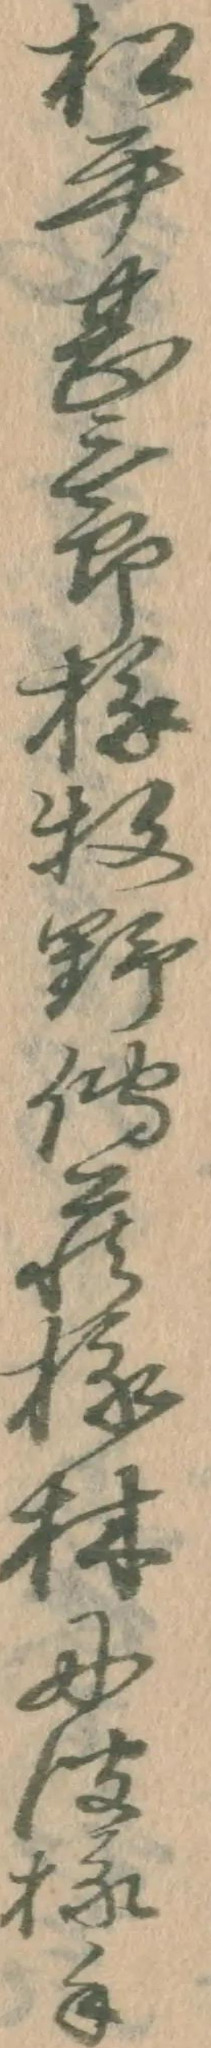一松平甚三郎様牧野伝蔵様林丹波様手
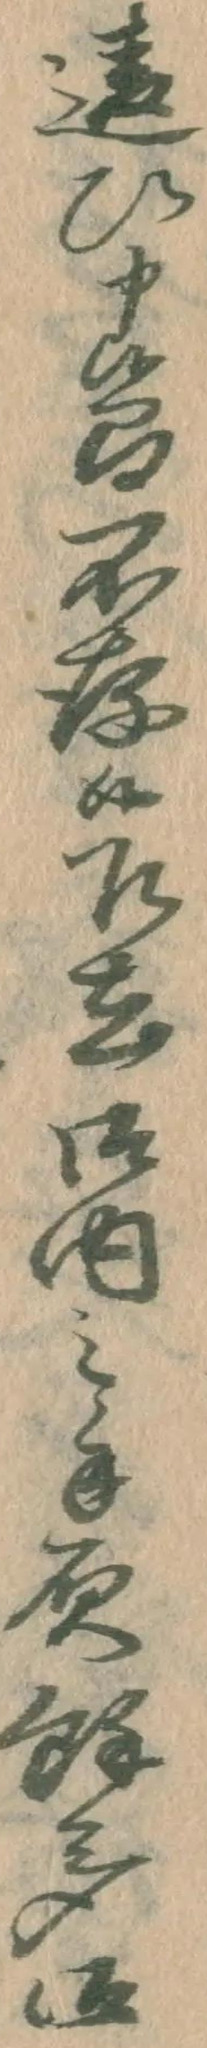違ひ申候間不存候乍去御内之手負余多御
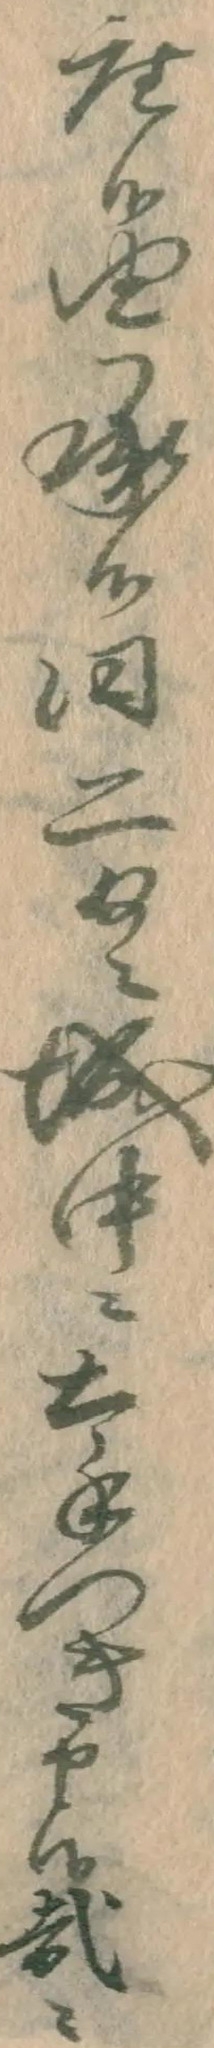座候由承候内二日に城中に土手つき申候哉に
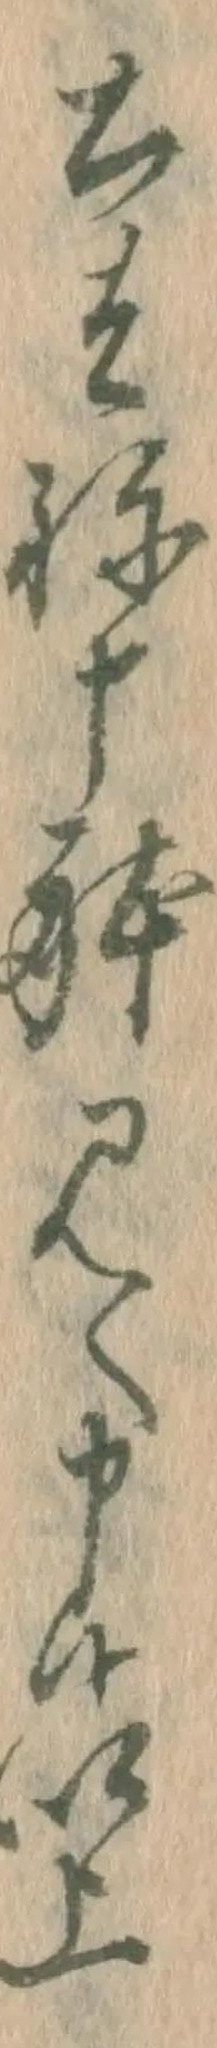土者弥申躰見へ申候以上
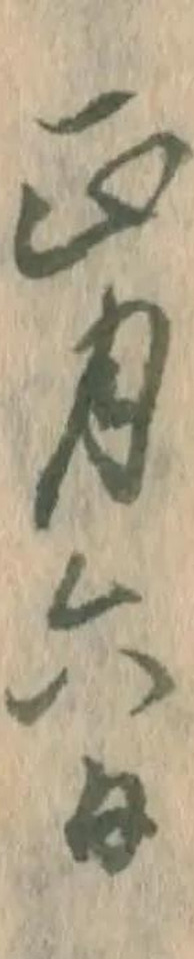正月六日
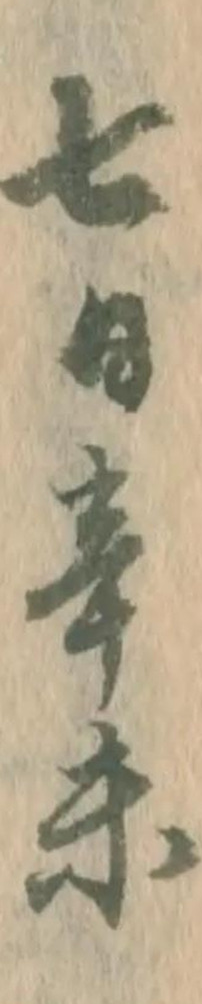七日辛未
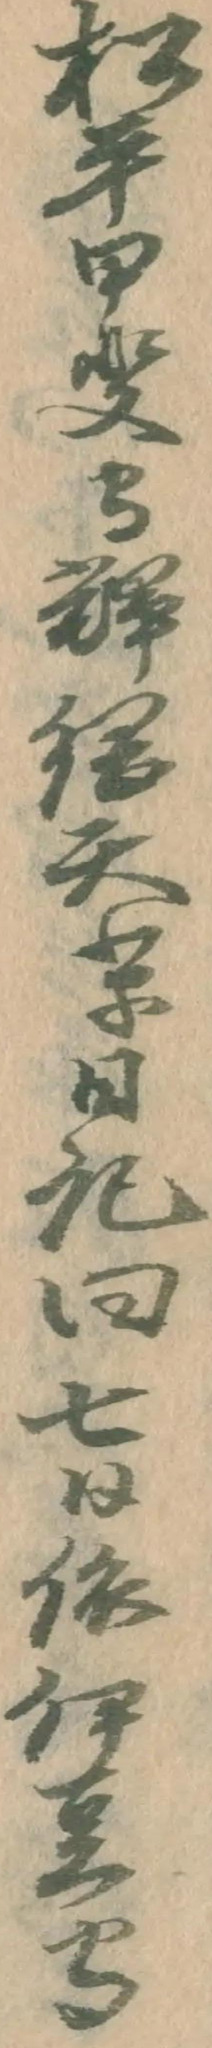松平甲斐守輝綱天草日記曰七日依伊豆守

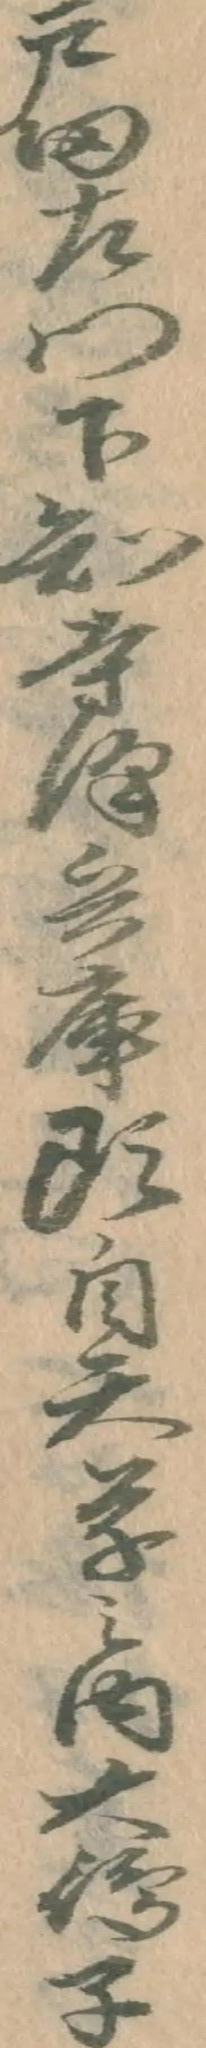戸田左門下知寺沢兵庫頭自天草之内大島子
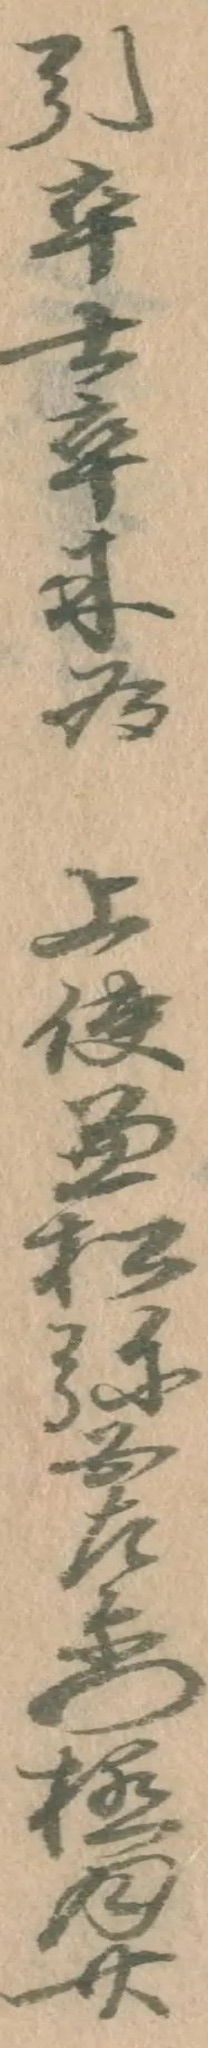引卒士卒来為上使兼松弥五左衛門極月廿
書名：切支丹御退治記 49巻. [5]
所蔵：国立国会図書館 National Diet Library, JAPAN
